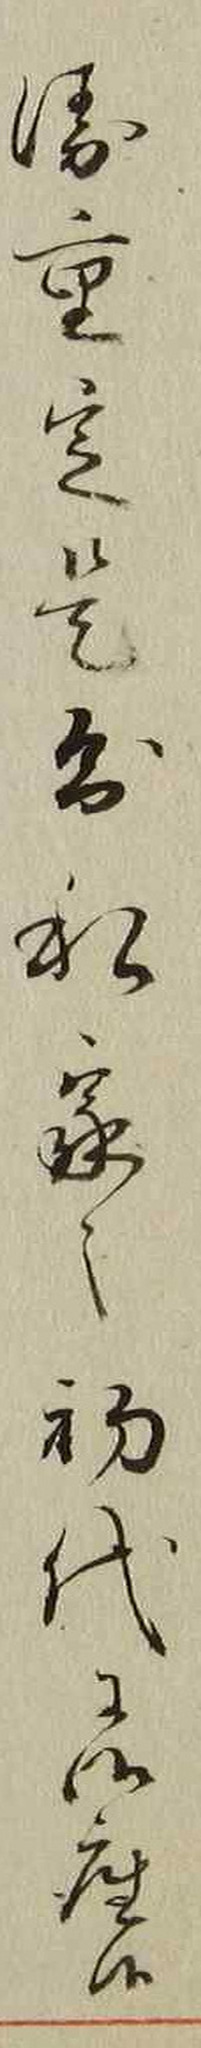衛重定是則私家之初代に御座候
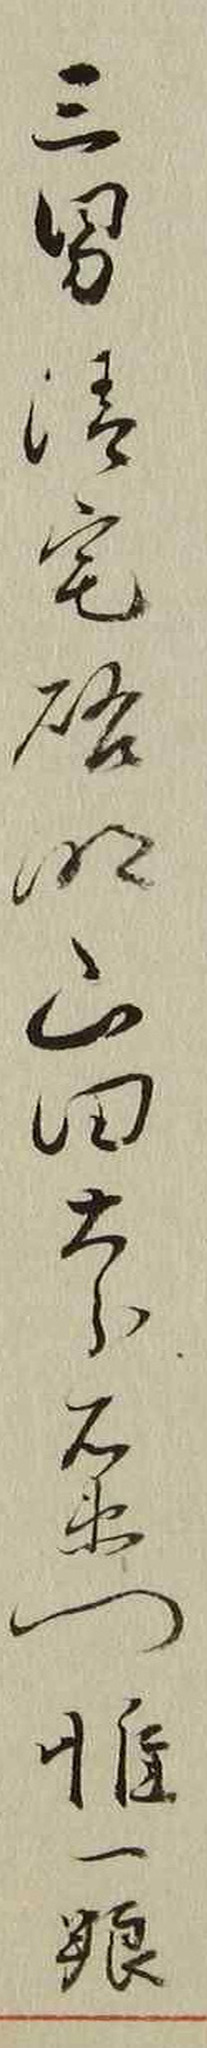三男清宅硌明山田太郎右衛門惟一羪
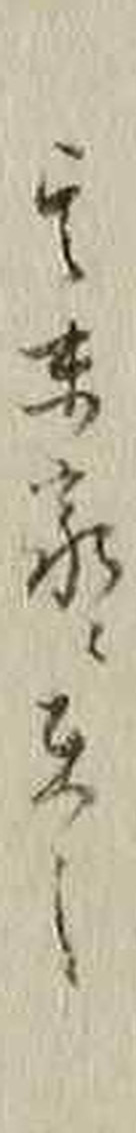其末ニ在之
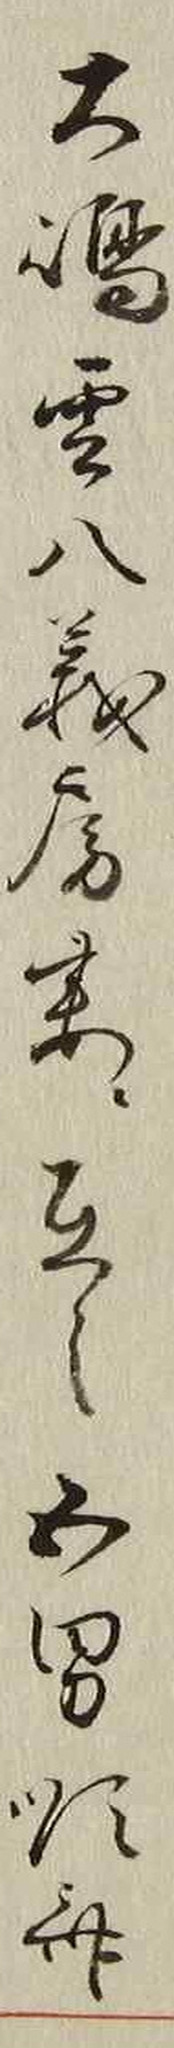大嶋雲八義房妻ニ在之五男順斎
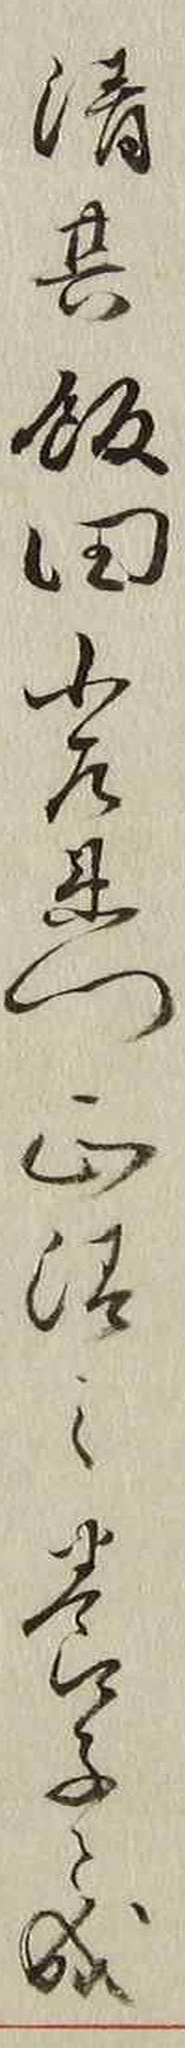清其飯田小左衛門正清之養子と成
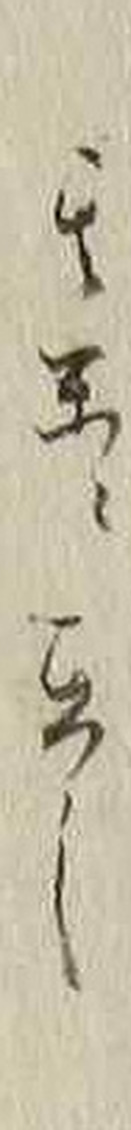其末ニ在之
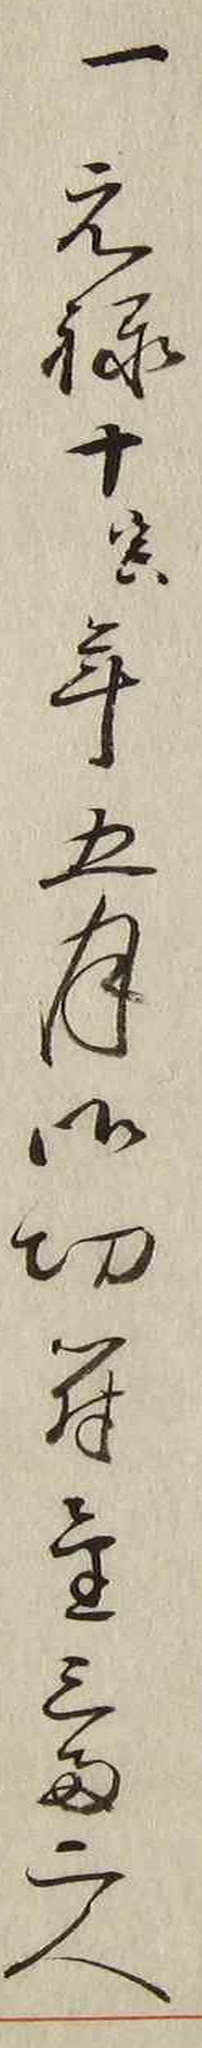一元禄十寅年五月御切符金三両二人
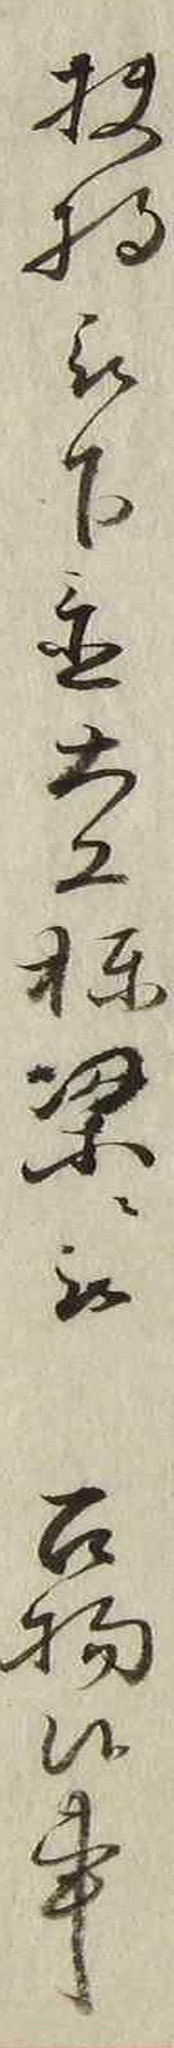扶持被下置大工棟梁ニ被召拘候事
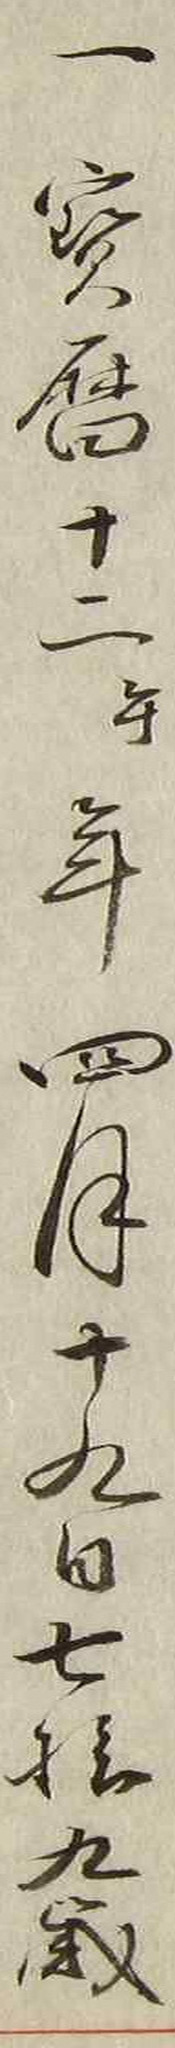一宝暦十二午年四月十九日七拾九歳
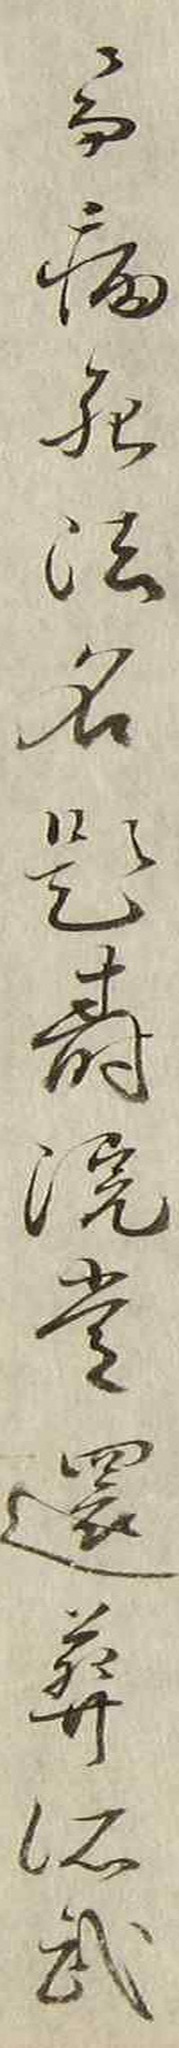ニ而病死法名題寿院常還葬所武
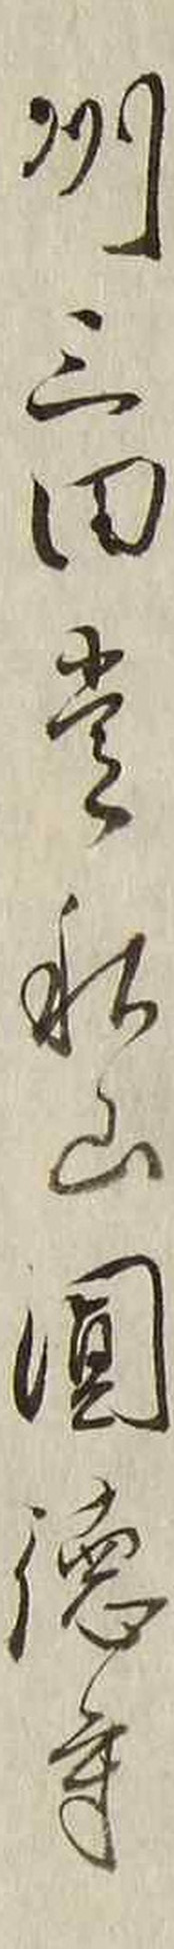州三田常秋山円徳寺

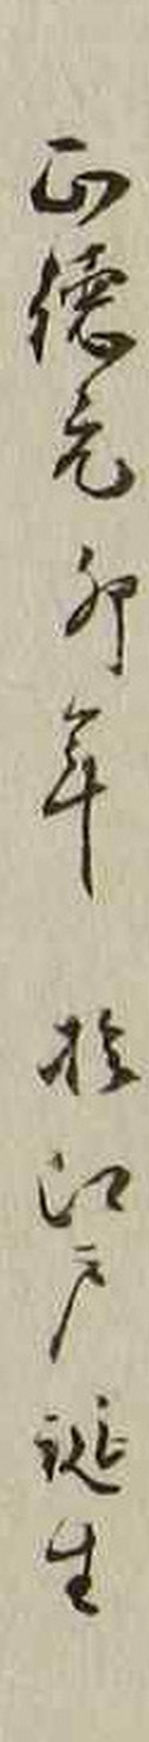正徳元卯年於江戸誕生
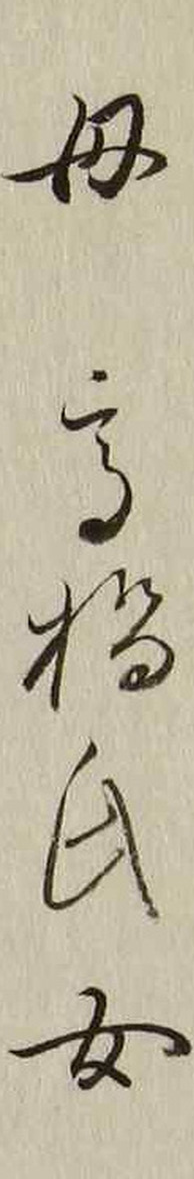母高橋氏女
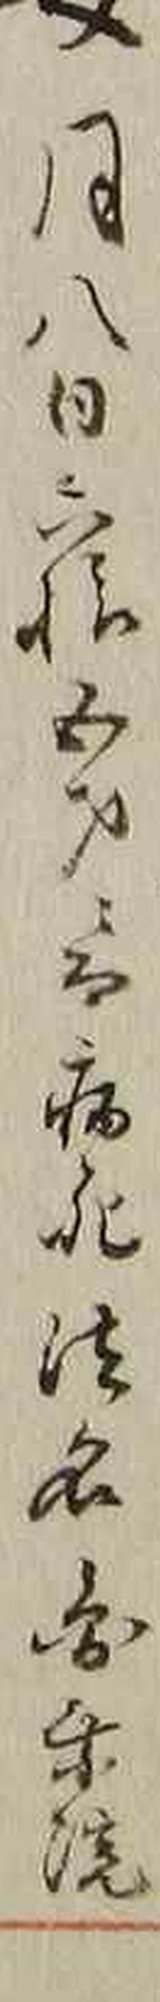月八日六拾五才ニ而病死法名円楽院
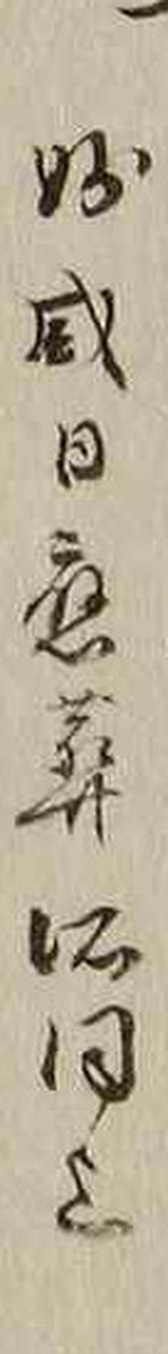妙日応葬所同上
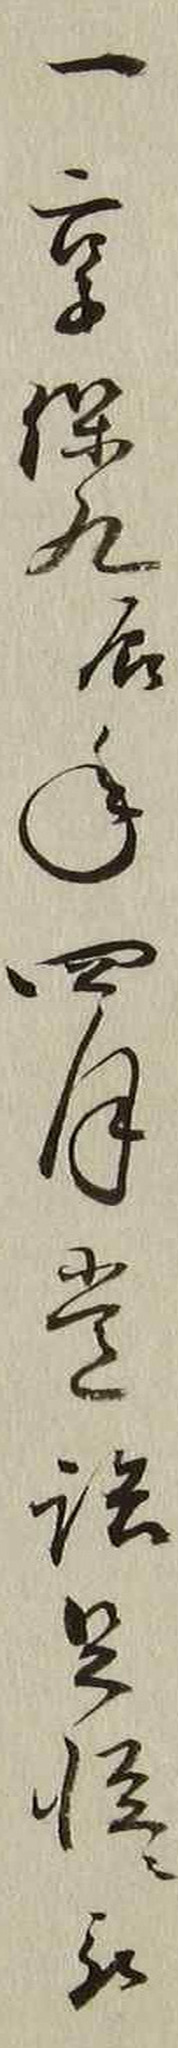一享保九辰年四月常？詰足軽ニ被
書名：諸士系譜　巻之4　い之部4
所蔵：会津若松市立会津図書館
